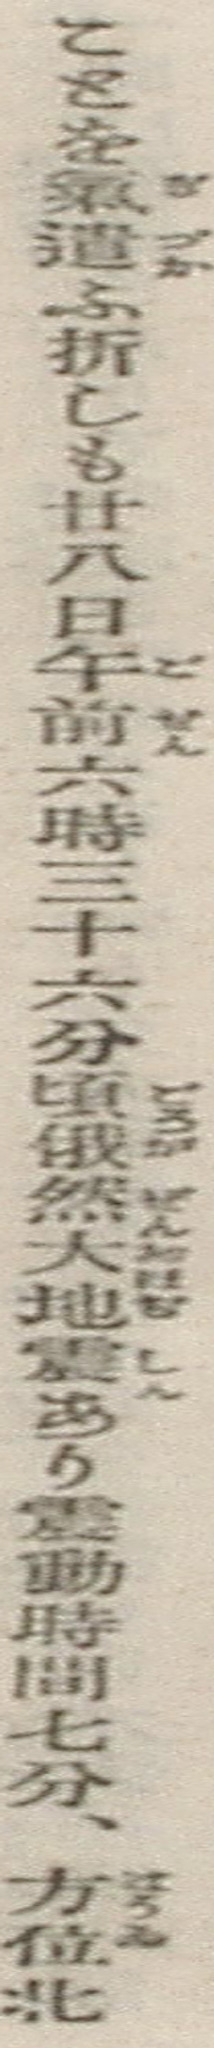ことを気遣ふ折しも廿八日午前六時三十六分頃俄然大地震あり震動時間七分、方位北
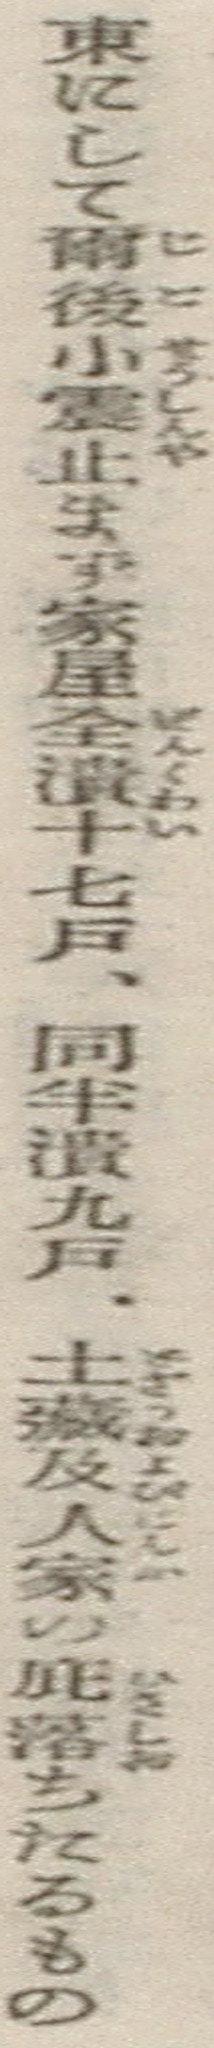東にして爾後小震止まず家屋全潰十七戸、同半潰九戸、土蔵及人家の庇落ちたるもの
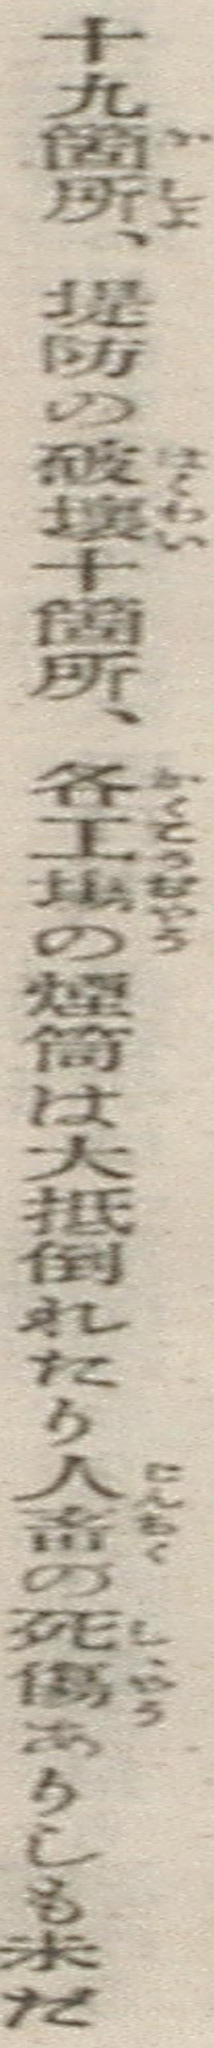十九箇所、堤防の破壊十個所、各工場の煙筒は大抵倒れたり人畜の死傷ありしも未だ
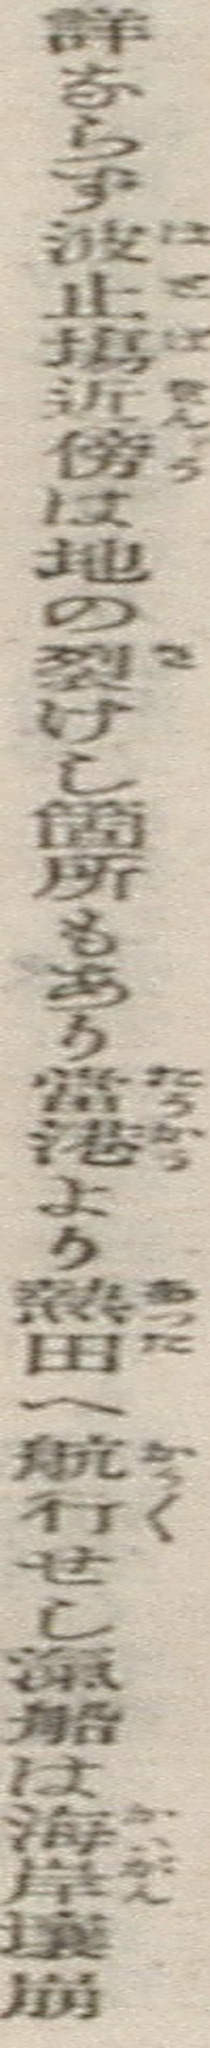詳ならず波止場近傍は地の裂けし箇所もあり当港より熱田へ航行せし氣船は海岸壊崩
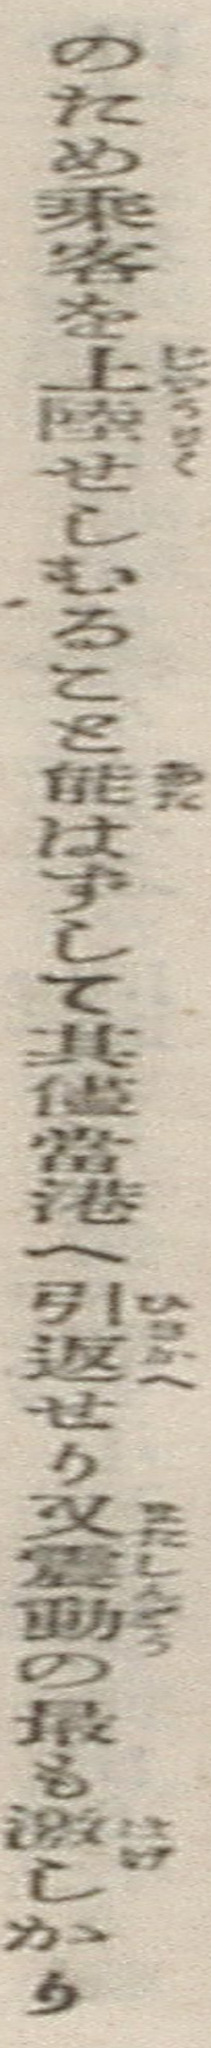のため乗客を上陸せしむること能はずして其儘当港へ引返せり又震動の最も激しかり
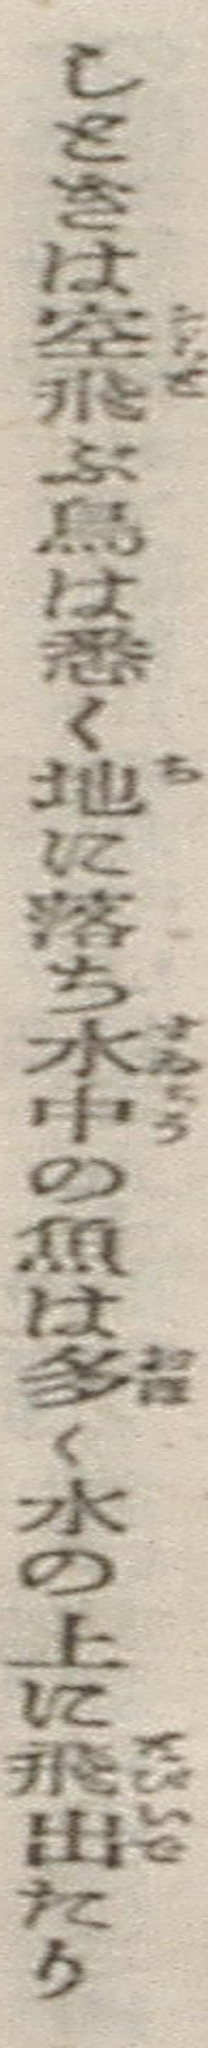しときは空飛ぶ鳥は悉く地に落ち水中の魚は多く水の上に飛出たり
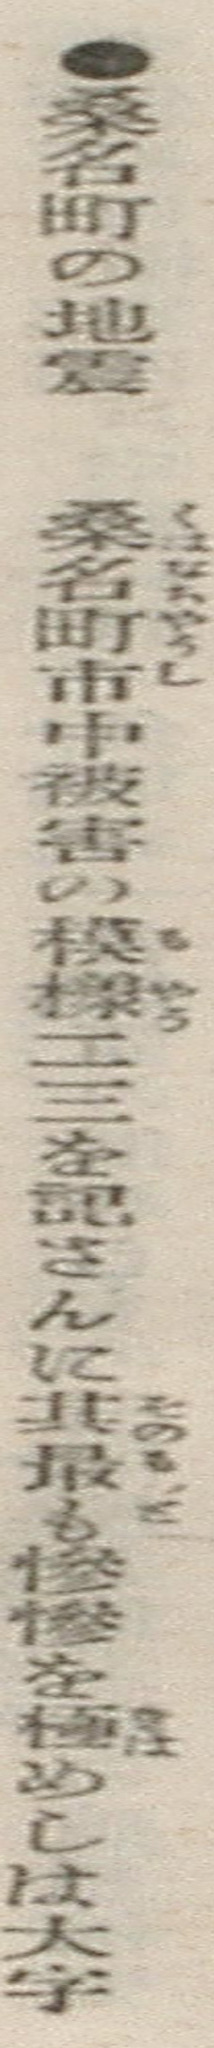●桑名町の地震桑名町市中被害の模様二三を認さんに其最も惨惨を極めしは大字
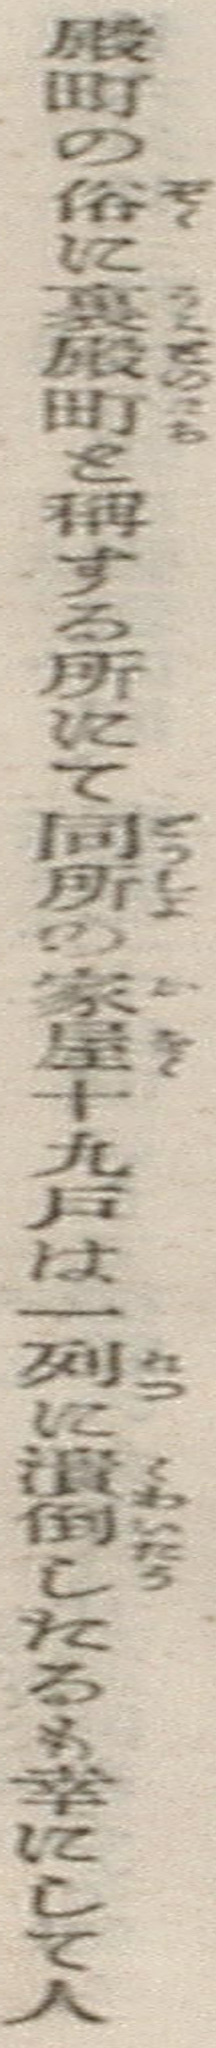殿町の俗に裏殿町と称する所にて同所の家屋十九戸は一列に潰倒したるも幸にして人
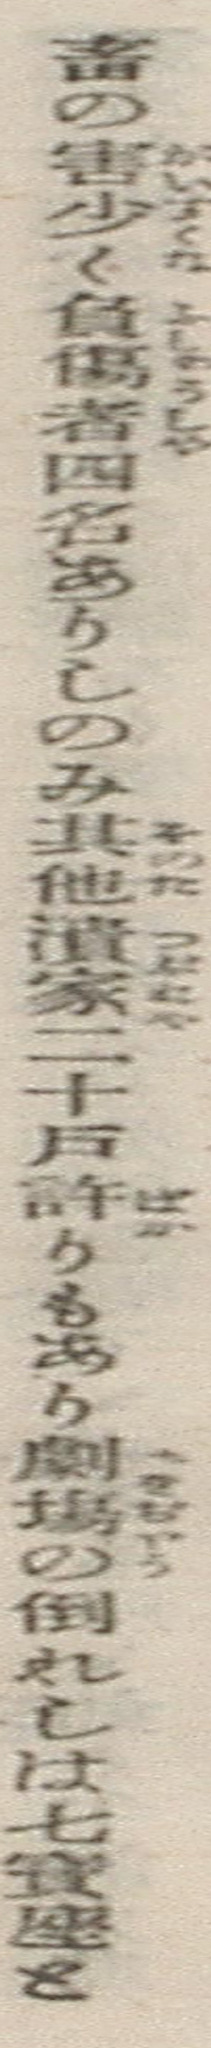畜の害少く負傷者四名ありしのみ其他潰家二十戸許りもあり劇場の倒れしは七實座と
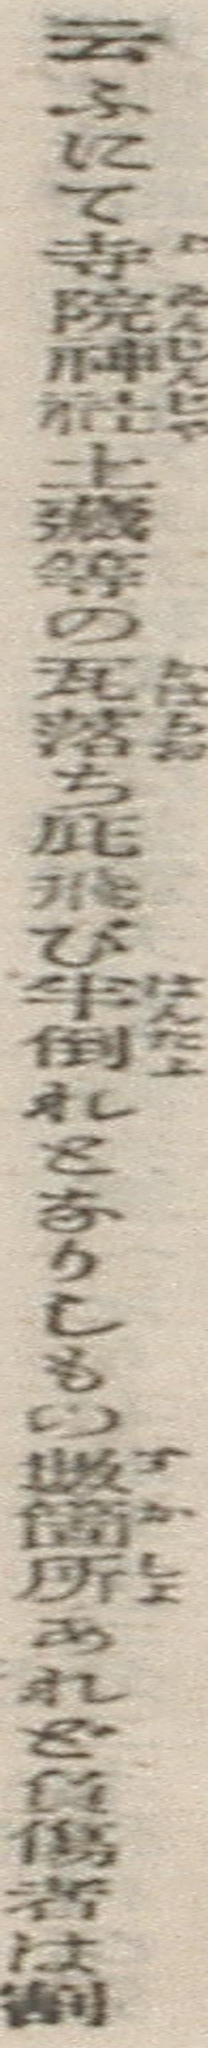云ふにて寺院神社土蔵等の瓦落ち庇飛び半倒れとなりしもの數箇所あれど負傷者は割
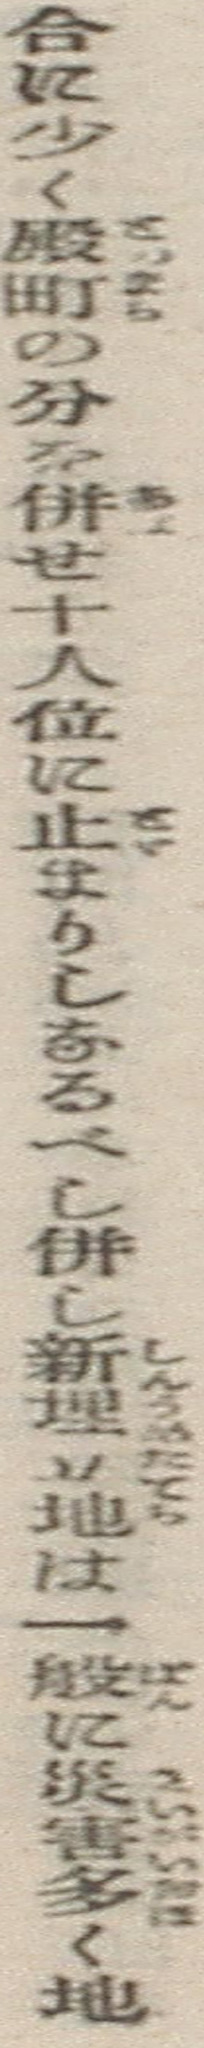合に少く殿町の分を併せ十人位に止まりしなるべし併し新埋立地は一般に災害多く地
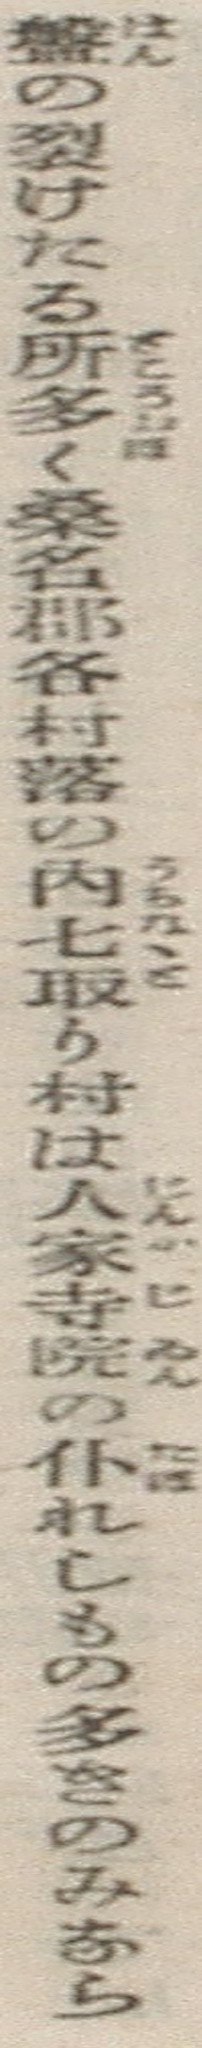盤の裂けたる所多く桑名郡各村落の内七取り村は人家寺院の仆れしもの多きのみなら
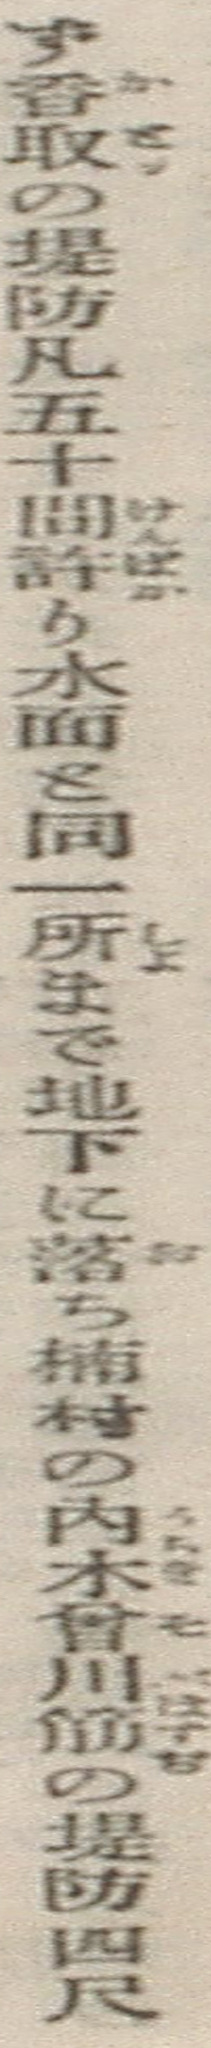ず香取の堤防凡五十間許り水面と同一所まで地下に落ち楠村の内木曽川筋の堤防四尺
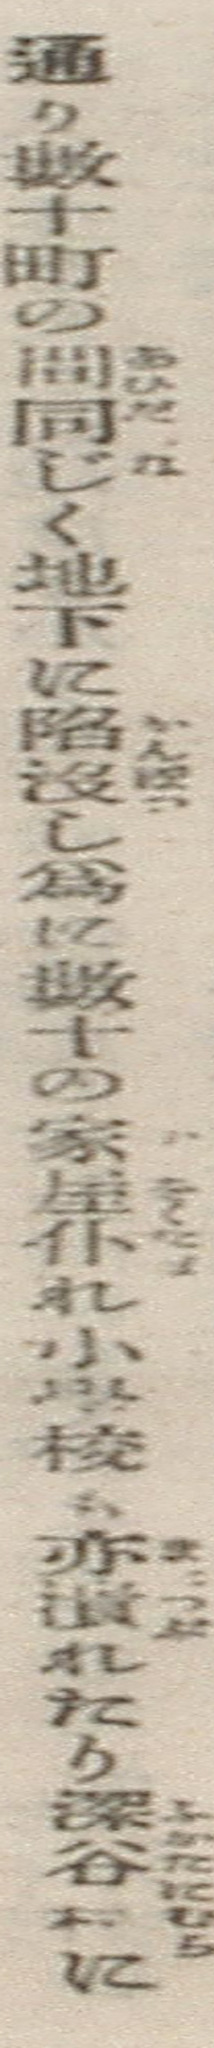通り數十町の間同じく地下に陥没し為に数十の家屋仆れ小學校も亦潰れたり深谷村に
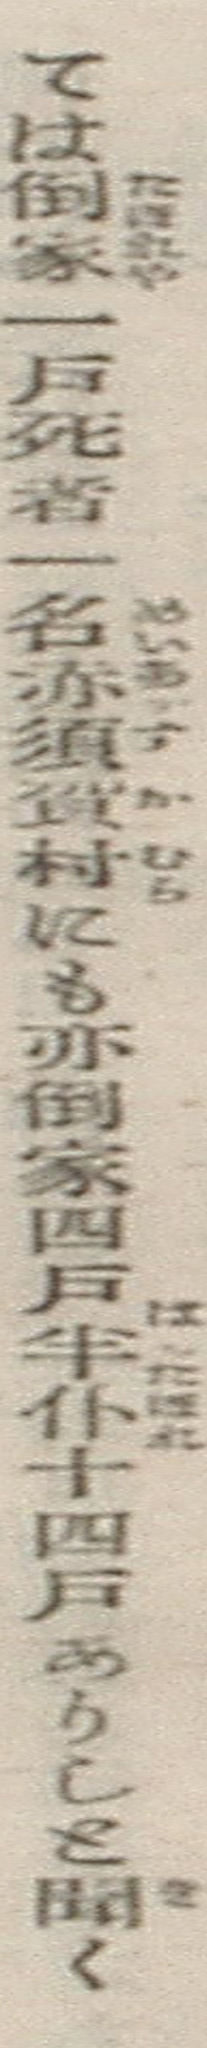ては倒家一戸死者一名赤須賀村にも亦倒家四戸半仆十四戸ありしと聞く
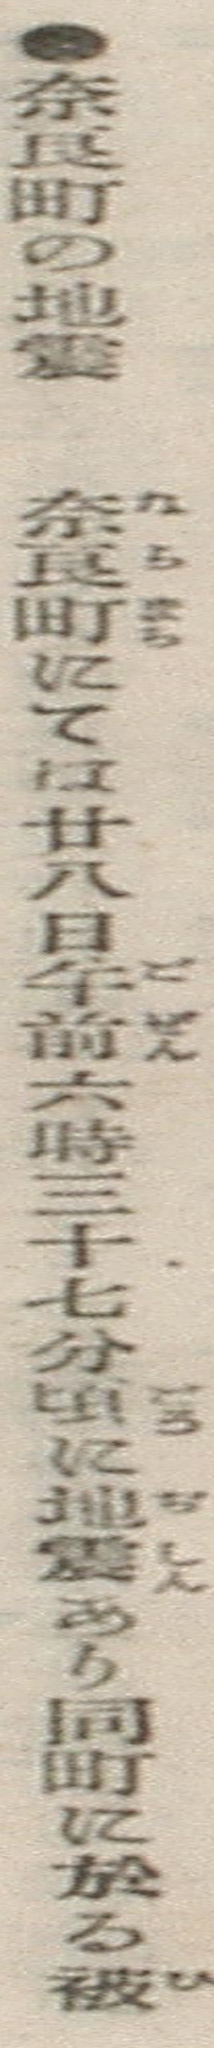●奈良町の地震奈良町にては廿八日午前六時三十七分頃に地震あり同町に於る被
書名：愛知岐阜福井三県　大地震見聞録（内題）
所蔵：東京大学地震研究所図書室 Earthquake Research Institute Library, The University of Tokyo, JAPAN
